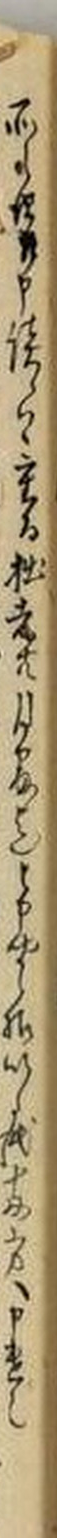所之儀申談候はゝ重て拙者共月番迄被申聞候様以手紙両方へ申遣之
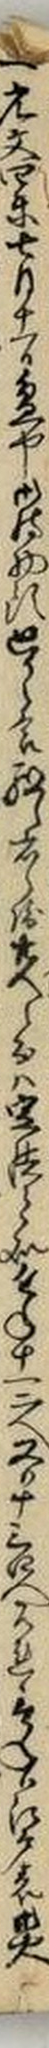一元文四未七月十一日盆中御持物頭廻り之節組之者之儀廿人之分は定詰に候処近年十一二人又は十三四人召連今年は江戸表御火
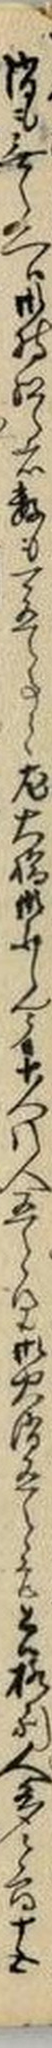消も無之候へは御持組之者数も可有之事に候尤大橋御ふしんに付十人引人有之候得共御火消有之候節とは格別人多に候間十五
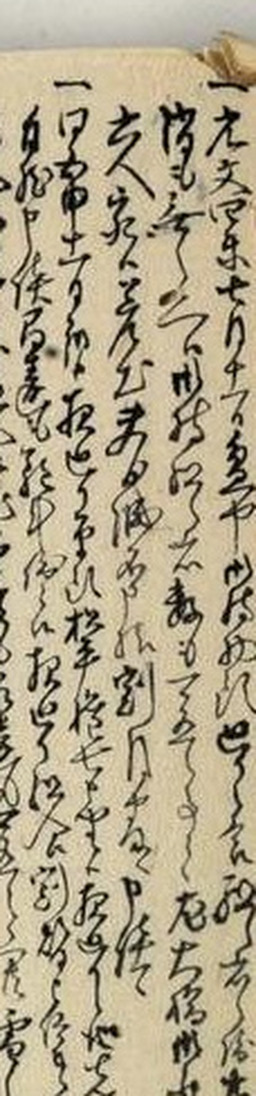六人宛は差出夫ゟ減不申様割月番へ申談候
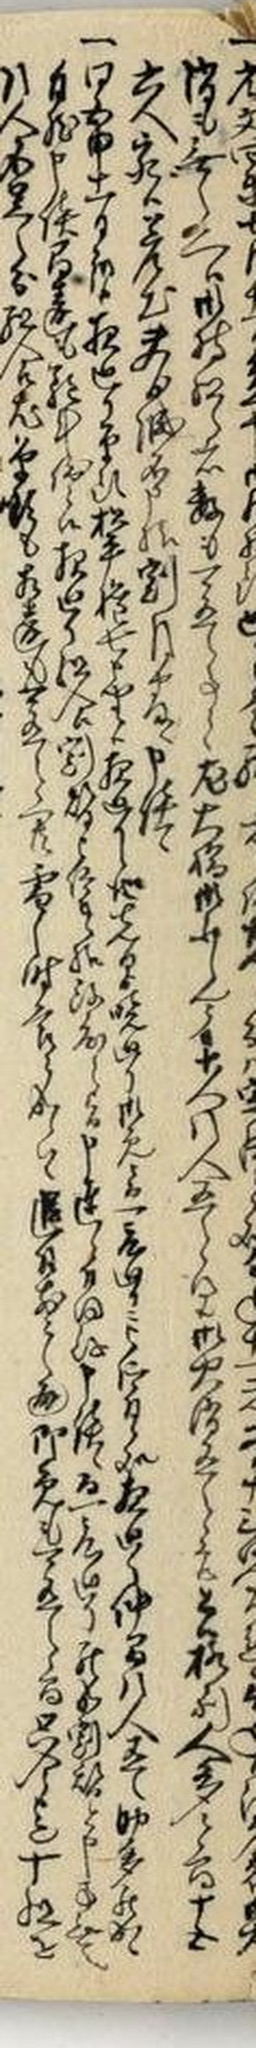一同五申十一月朔日夜廻り筆頭松平権七申聞候は夜廻り之儀先日ゟ暁廻り御免にて一度廻りに被仰付候処夜廻り仲間引人有之助多罷成候
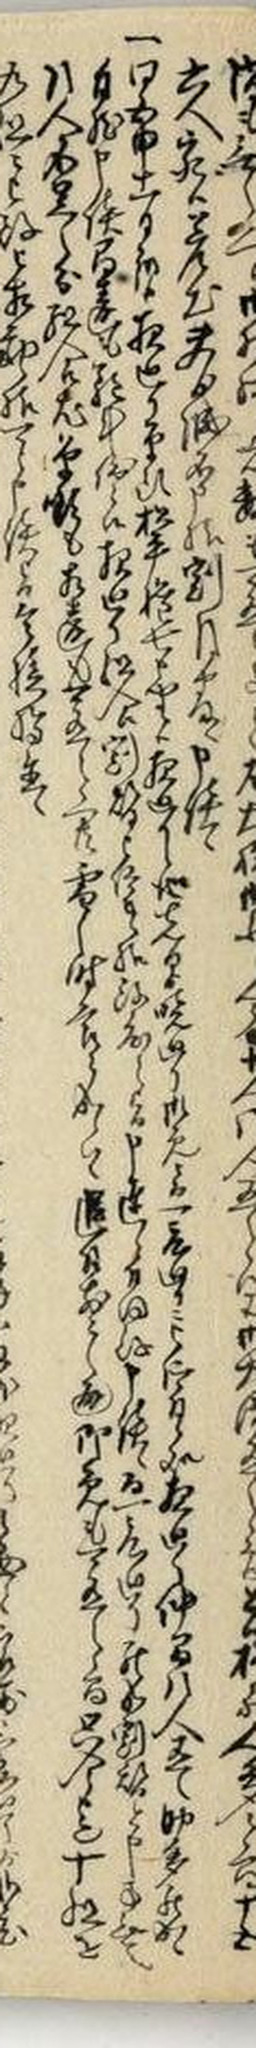自然申談間違も難斗儀に候夜廻り組合割替被仰付候様致度之旨申達候付同役申談候て一度廻り罷成割替と申事無之
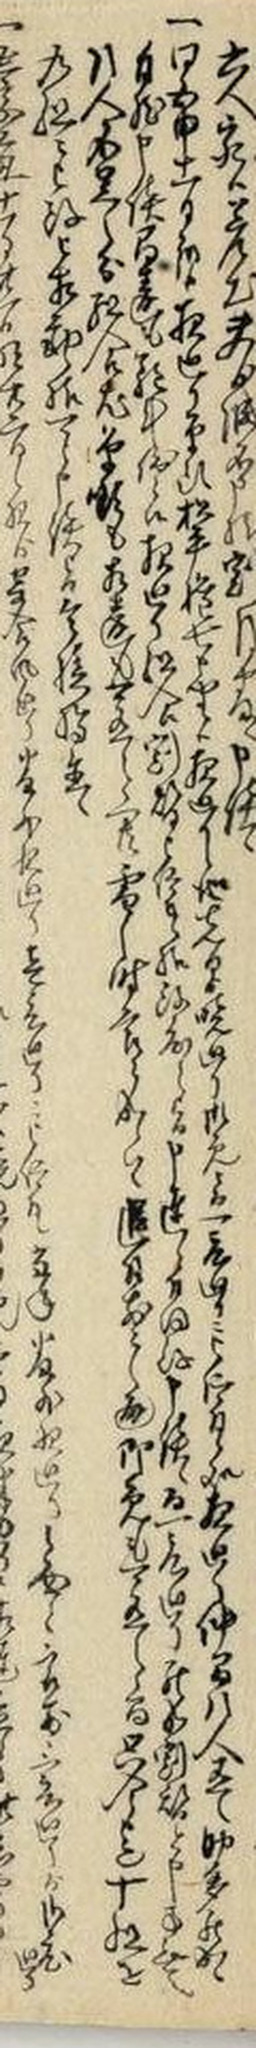引人不足之分組合尤筆頭も相違も可有之候へ共雪の時節に成候はゝ追付前々之通御免も可有之候間只今迄十組を
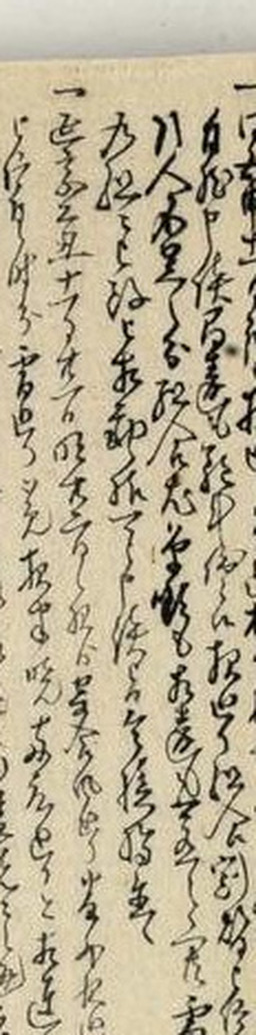九組に被改被相勤候様可被申談旨令挨拶置候
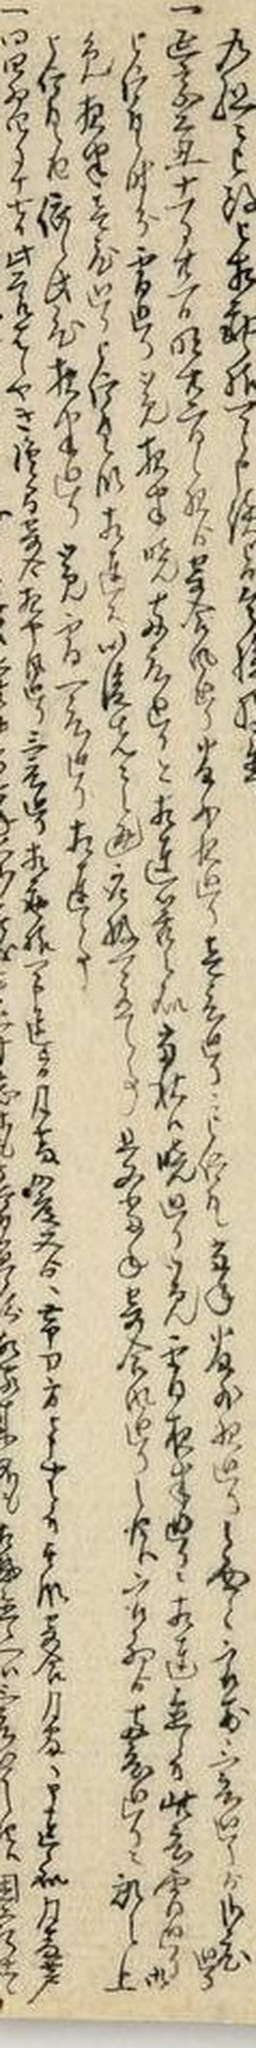免夜半壱度廻り被仰付候段相達ス以後先々之通取扱可有之事且又当年寄合風廻り之儀は最初ゟ両度廻りに願之上
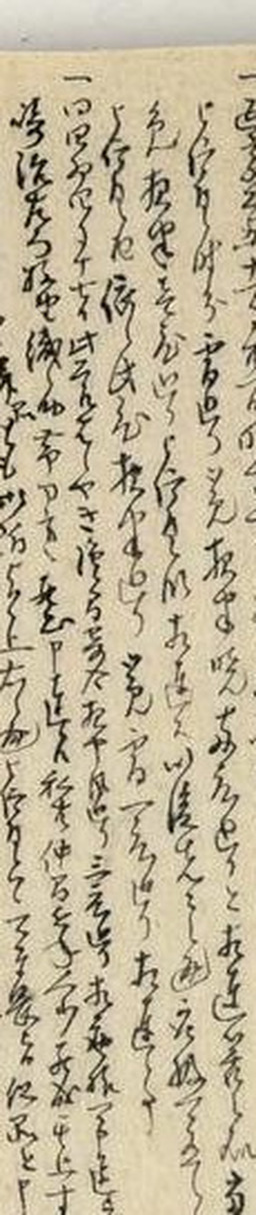被仰付候由依之此度夜半廻り御免宵一度廻り相達候事
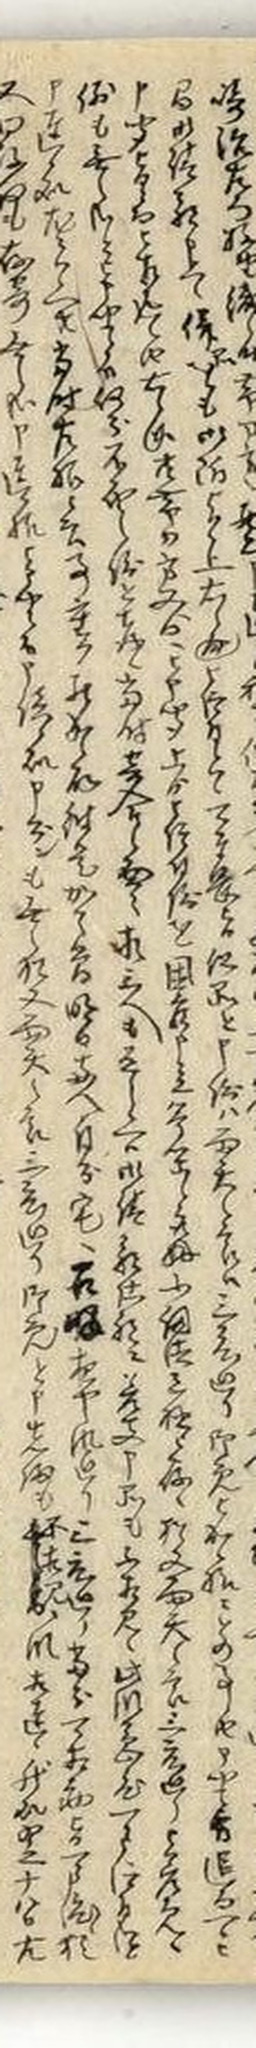儀も無之哉と被申聞候に付何分不届之儀と奉存候当時寄合之面々拾三人も有之候へは御請難仕程に差支申品も不相見候此段急度可被仰付哉と
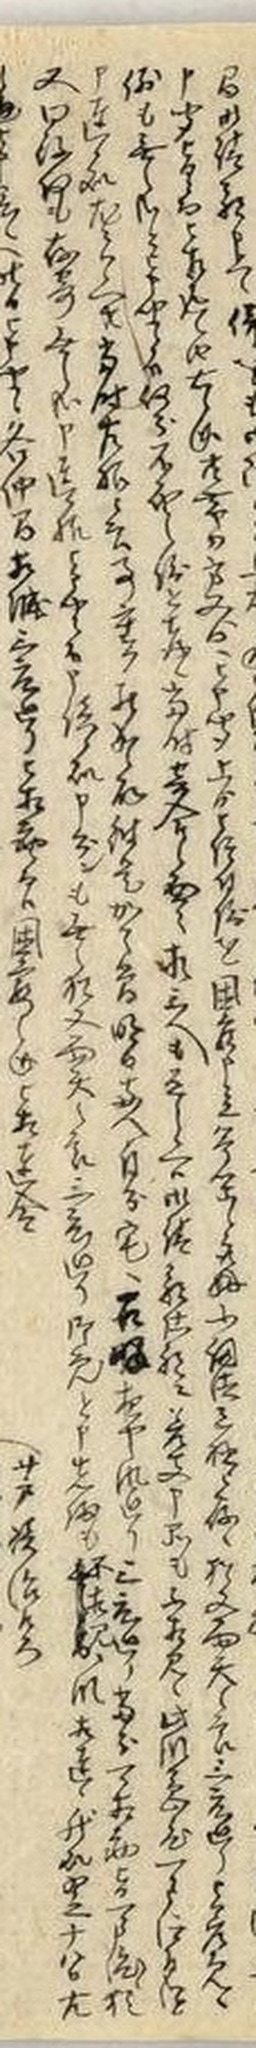申達候処尤には候へ共当時左様にては事重ク罷成候故彼是加了簡明日両人自分宅へ召呼夜中風廻り三度廻り当分可相勤旨可申渡候猶
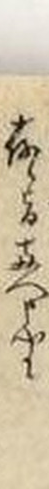存候旨両人申聞候

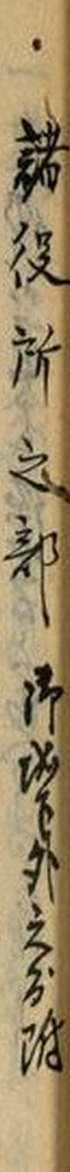諸役所之部御城下外之分附
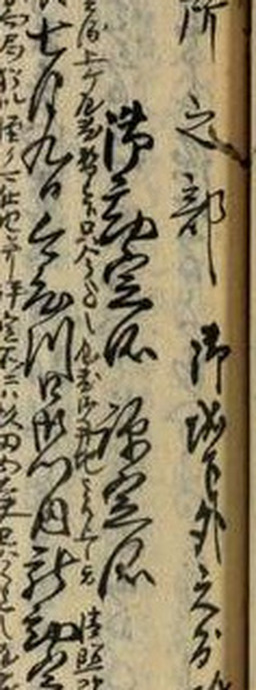御勘定所評定所
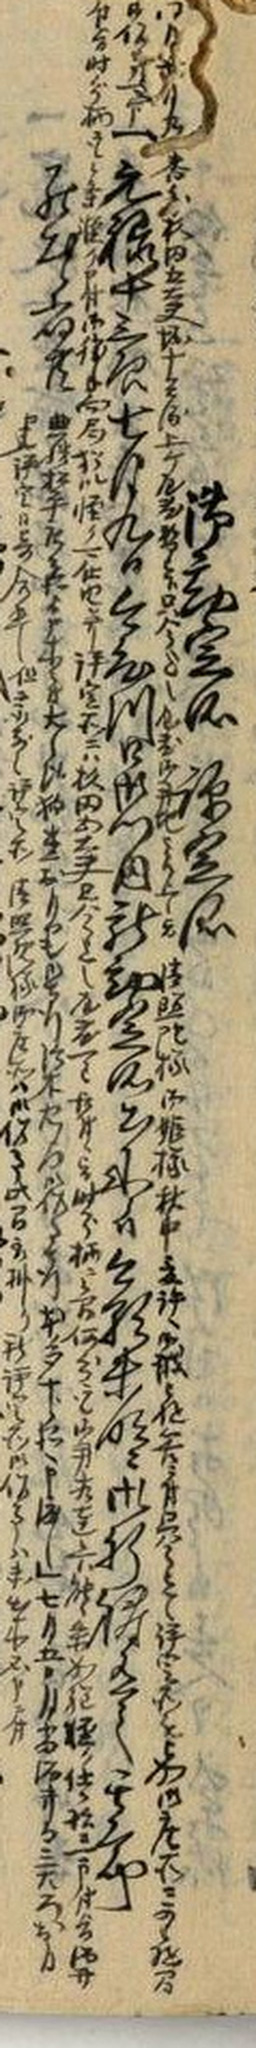一元禄十三辰七月九日今度川口御門内新勘定所出来候付今朝未明に御祈祷有之其節
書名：御城下諸事之部
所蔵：福井県文書館 Fukui Prefectural Archives
